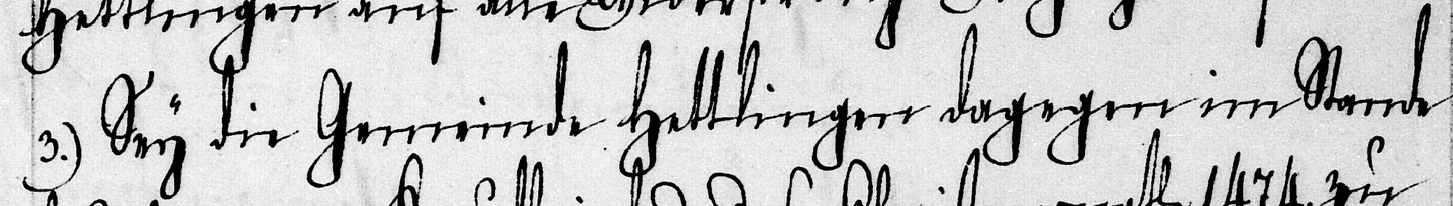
3.) Sey die Gemeinde Hettlingen dagegen im Stande
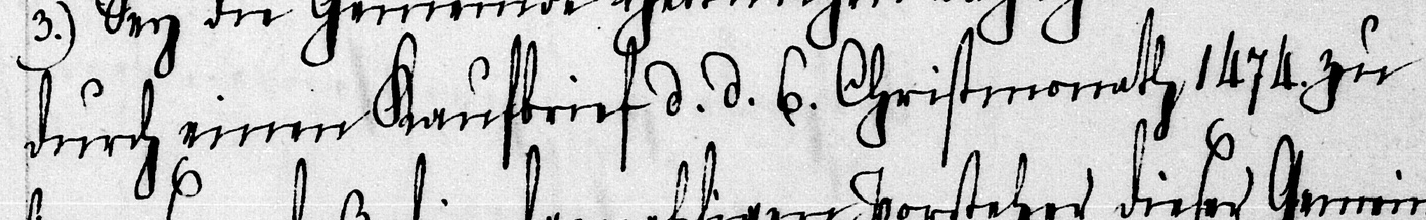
durch einen Kaufbrief d. d. 6. Christmonath 1474. zu
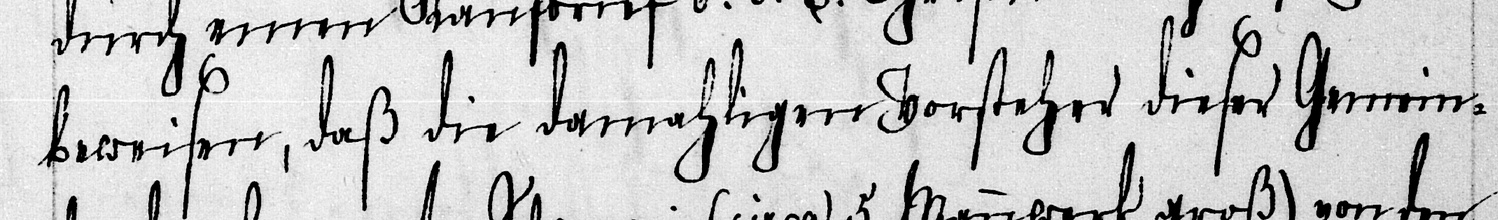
beweisen, daß die damahligen Vorsteher dieser Gemein¬
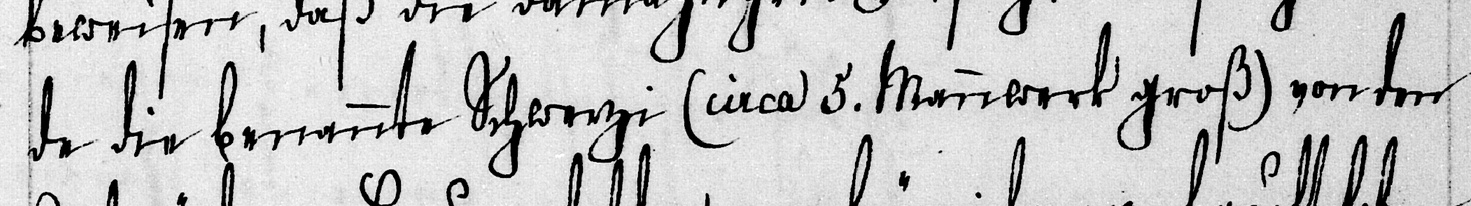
de die benannte Schwerzi (circa 5. Mannwerk groß) von den
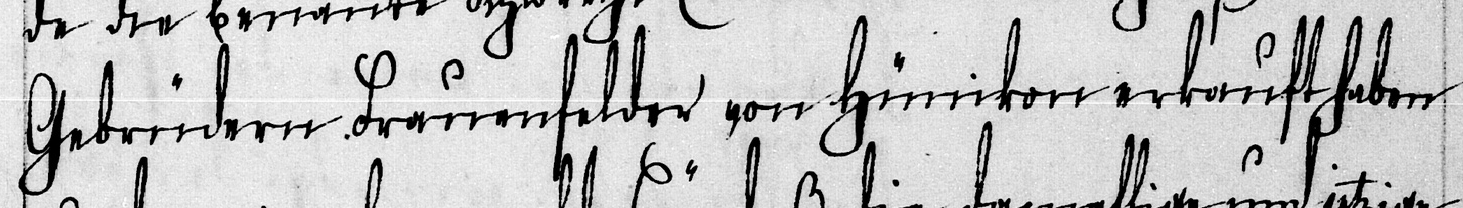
Gebrüdern Frauenfelder von Hünikon erkauft haben
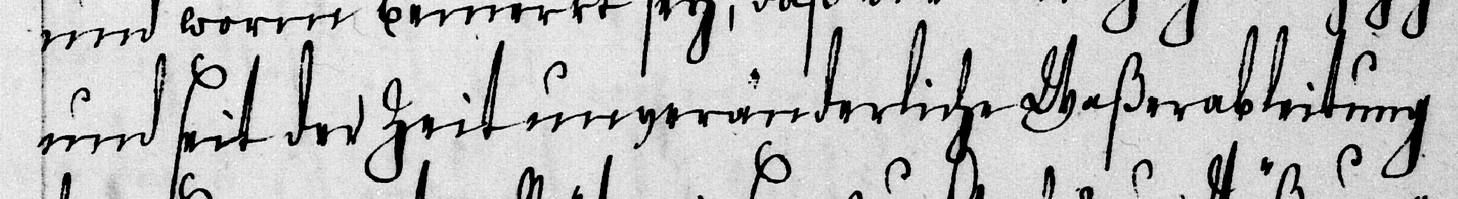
und seit der Zeit unveränderliche Waßerableitung
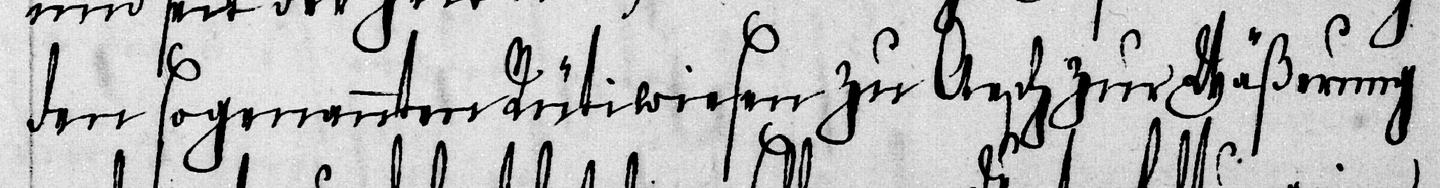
den sogenannten Rütiwiesen zu Aesch zur Wäßerung
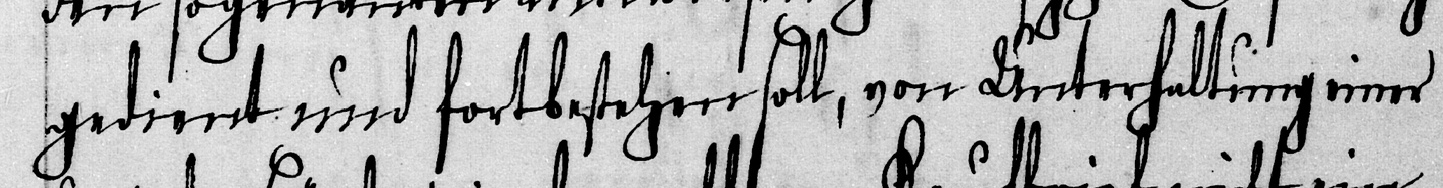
gedient und fortbestehen soll, von Unterhaltung einer
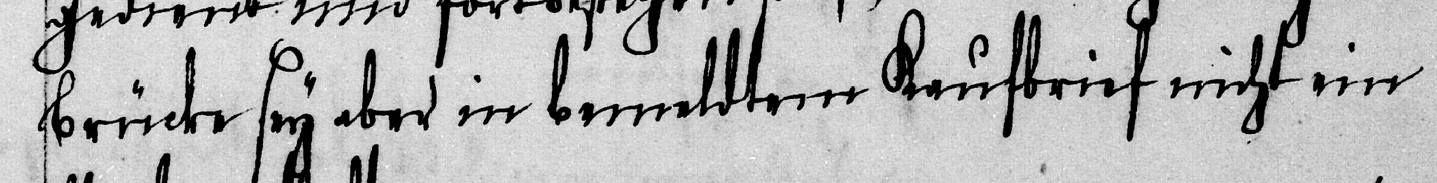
Brücke sey aber in bemeldtem Kaufbrief nicht ein
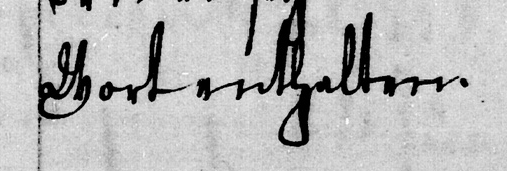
Wort enthalten.
